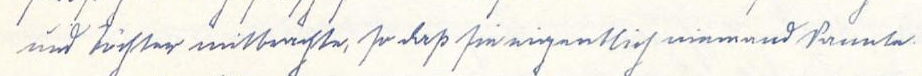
und Kinder mitbrachte, so daß sie eigentlich niemand kannte.
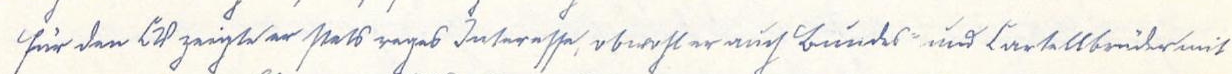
Für den CV zeigte er selbst reges Interesse, obwohl er auch Bundes- und Cartellbrüder mit
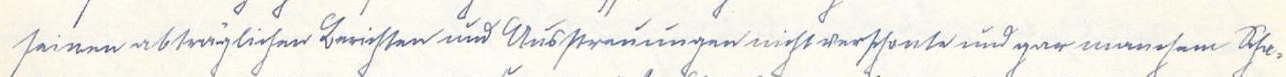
seinen abträglichen Berichten und Ausstreuungen nicht verschonte und gar manchen Scha-
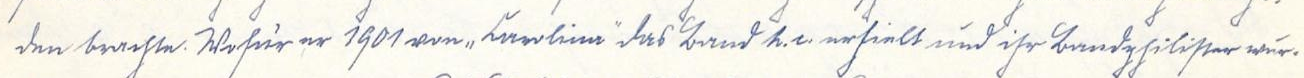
den brachte. Wofür er 1901 von „Caroline“ hat das Band h. c. erhielt und ihr Band philister wur-
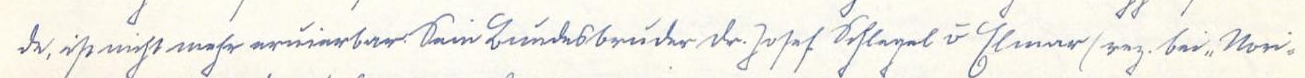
de, ist nicht mehr eruierbar. Sein BundesBruder Dr. Josef Schlegel v/o Elmar (rez. bei „Nori
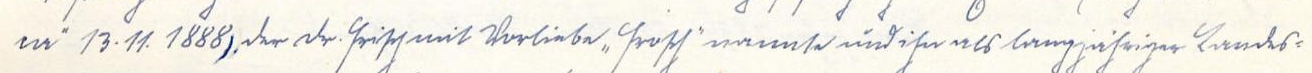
ca“ 13.11.1888), der Dr. Frisch mit Vorliebe Frosch nannte und ihn als langjähriger Landes-
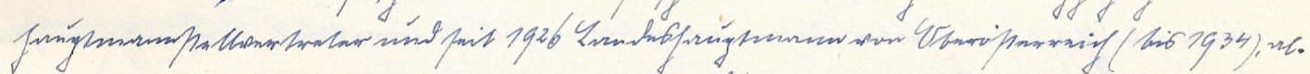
hauptmannstellvertreter und seit 1926 Landeshauptmann von Oberösterreich (bis 1934), also
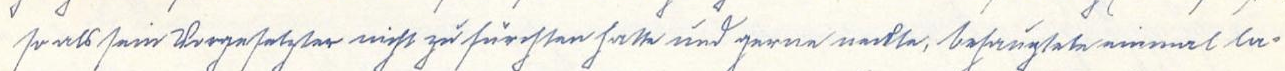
als sein Vorgesetzter nicht zu fürchten hatte und gerne neckte, behauptete einmal la-
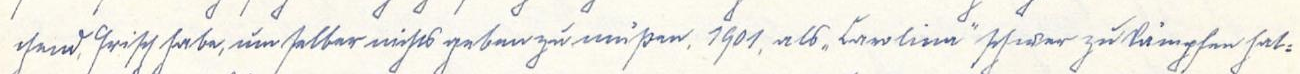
chend, Frisch habe, um selber nichts geben zu müssen, 1901, als „Carolina“ schwer zu kämpfen hat-
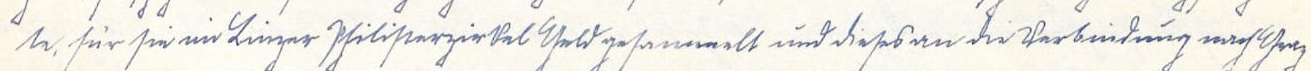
te, für sie im Linzer Philisterzirkel Geld gesammelt und dieses an die Verbindung nach Graz
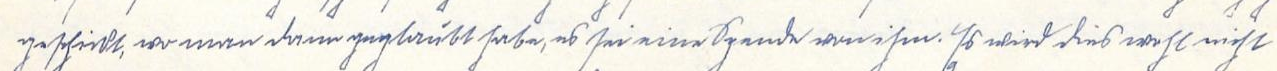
geschickt, wo man dann geglaubt habe, es sei eine Spende von ihm. Es wird dies wohl nicht
